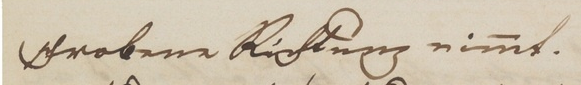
schrobene Richtung nimmt.
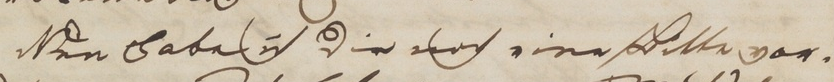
Nun habe ich dir noch eine Bitte vor-
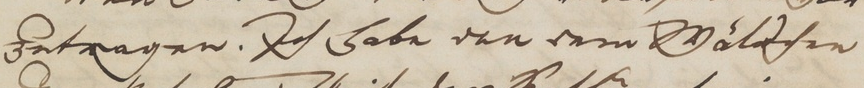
zutragen. Ich habe den dem Wäldchen
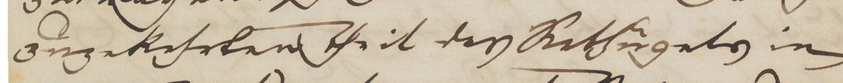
zugekehrten Theil des ...thügels in
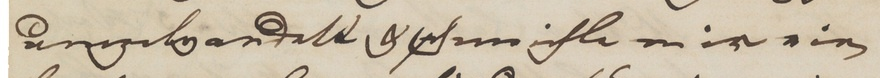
umgewandelt & schmeichle mir ein
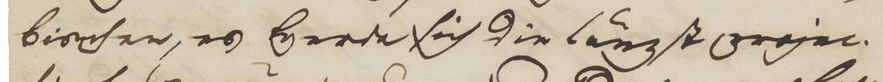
bischen, es werde sich die längst projec-
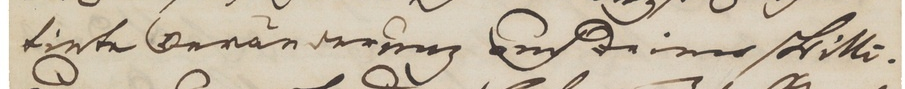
tirte Veränderung auch Deiner Billi-
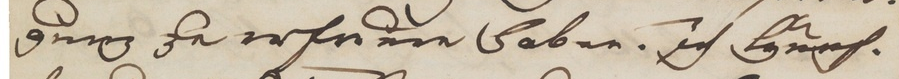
gung zu erfreuen haben. Ich wünsch-
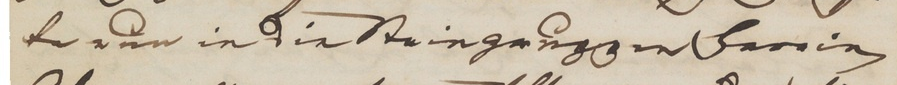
te nur in die Steingruppen herein
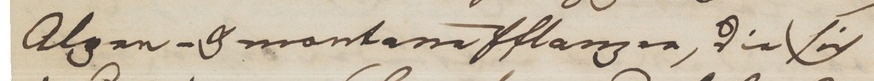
Alpen- & montane Pflanzen, die sich
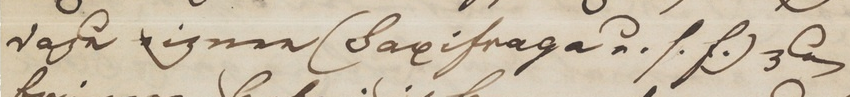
dazu eignen (Saxifraga u. s. f.) zu
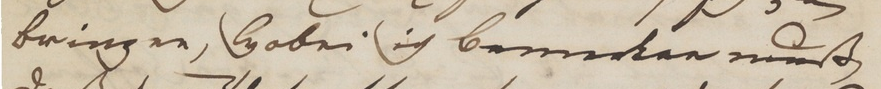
bringen, wobei ich bemerken muß,
